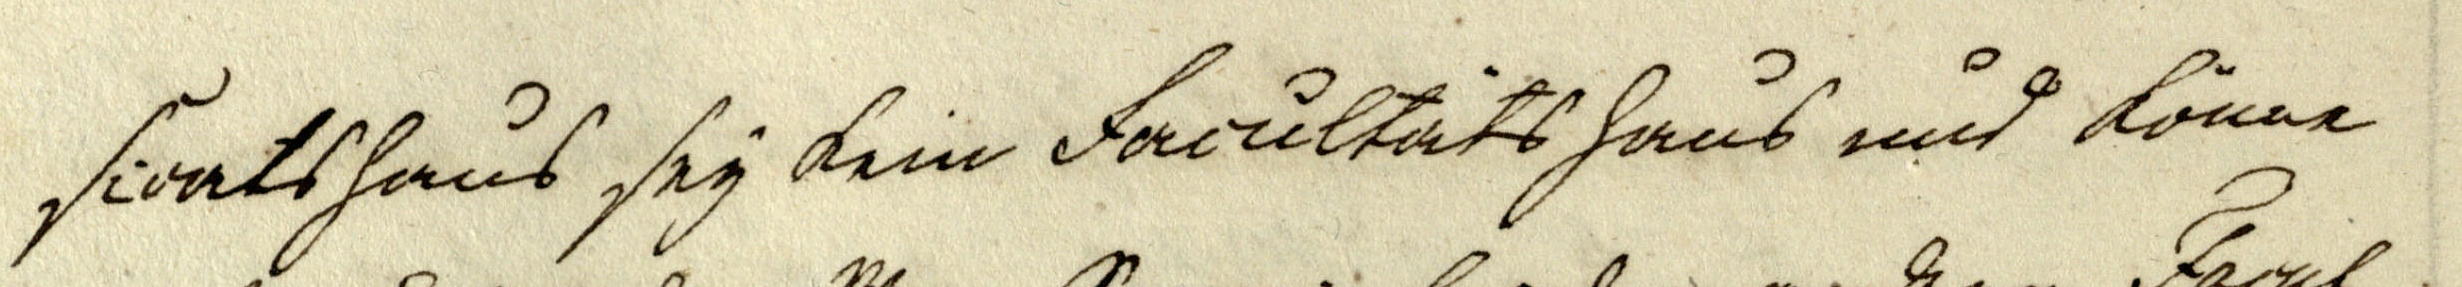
sicatshaus seÿ kein Facucltätshaus und könne
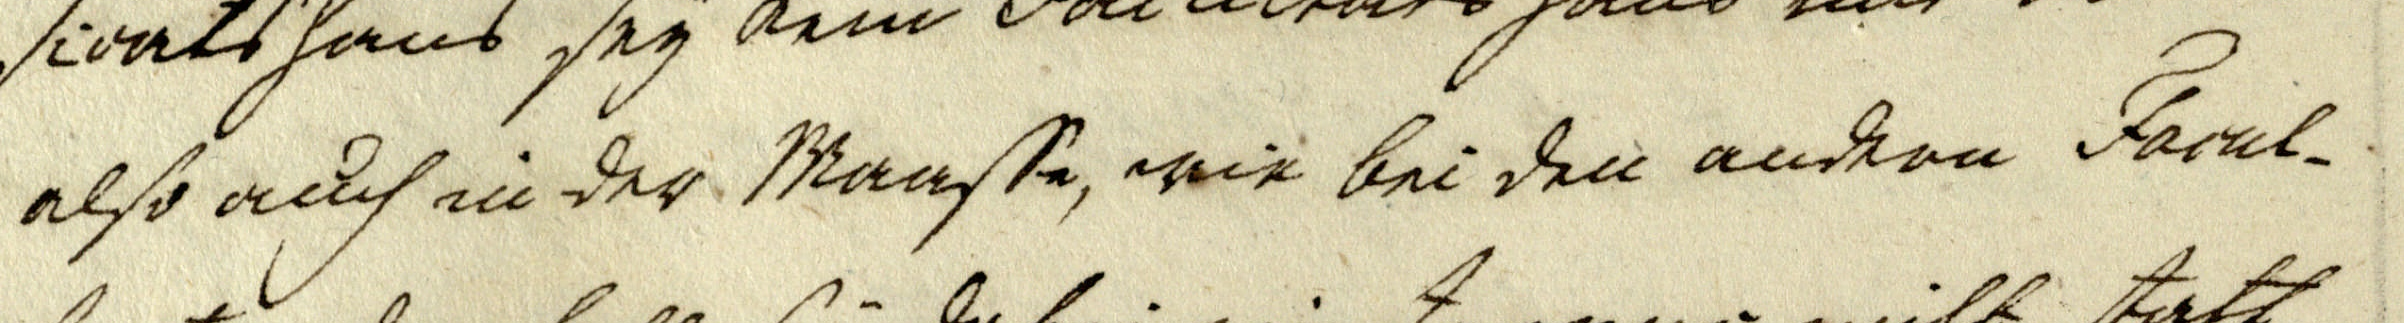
also auch in der Maasse, wie bei den andern Facul¬
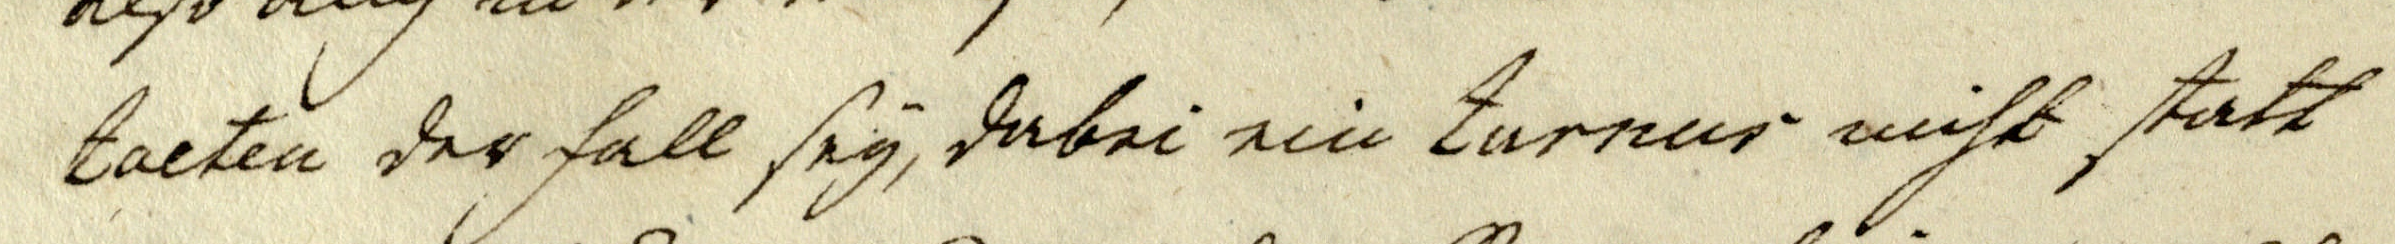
taeten der Fall seÿ, dabei ein turnus nicht statt
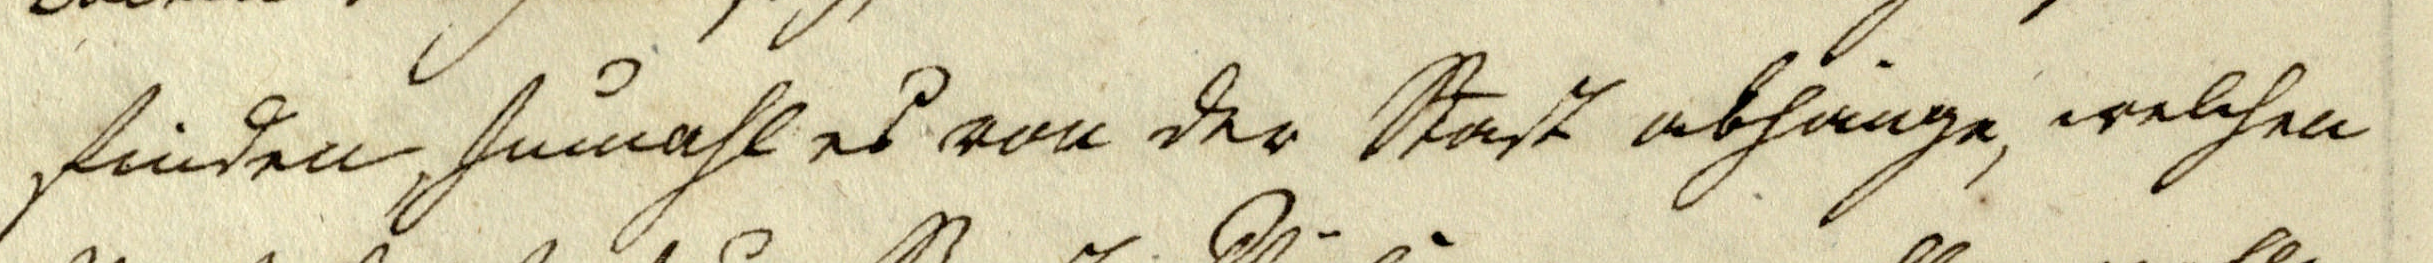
finden, zumahl es von der Stadt abhänge, welchen
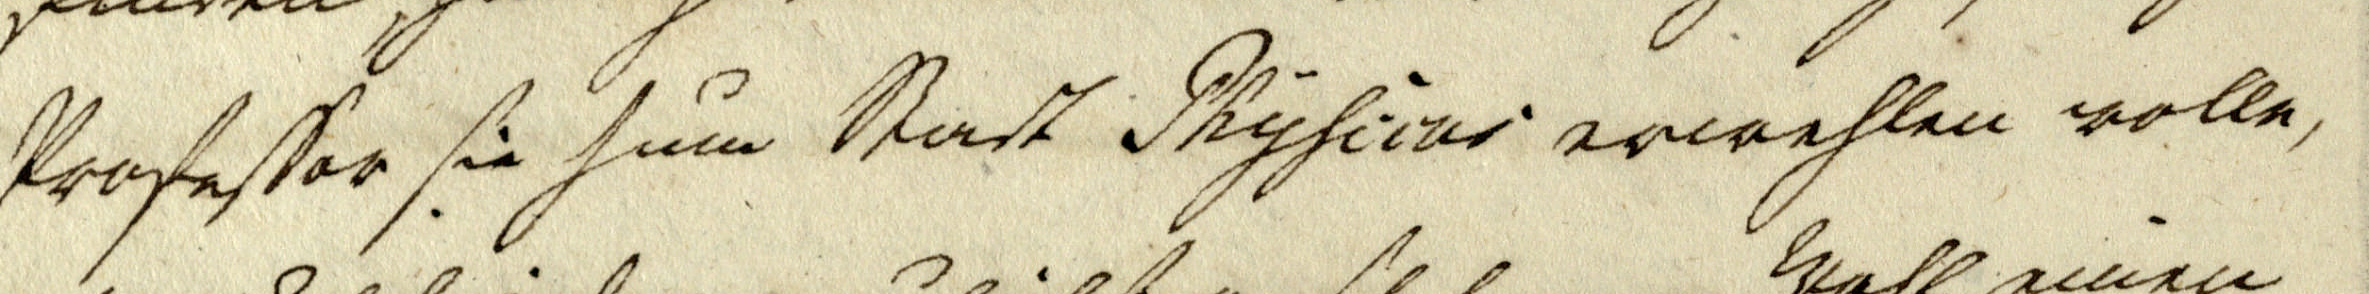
Professor sie zum Stadt Phÿsicus erwehlen wolle,
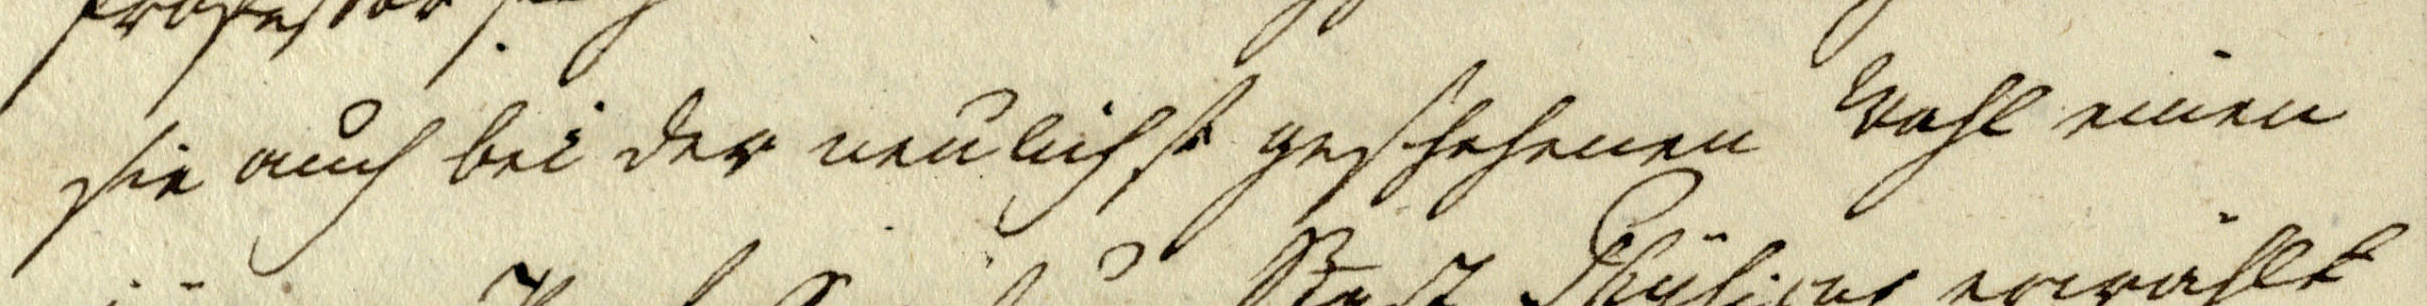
sie auch bei der neulichst geschehenen Wahl einen
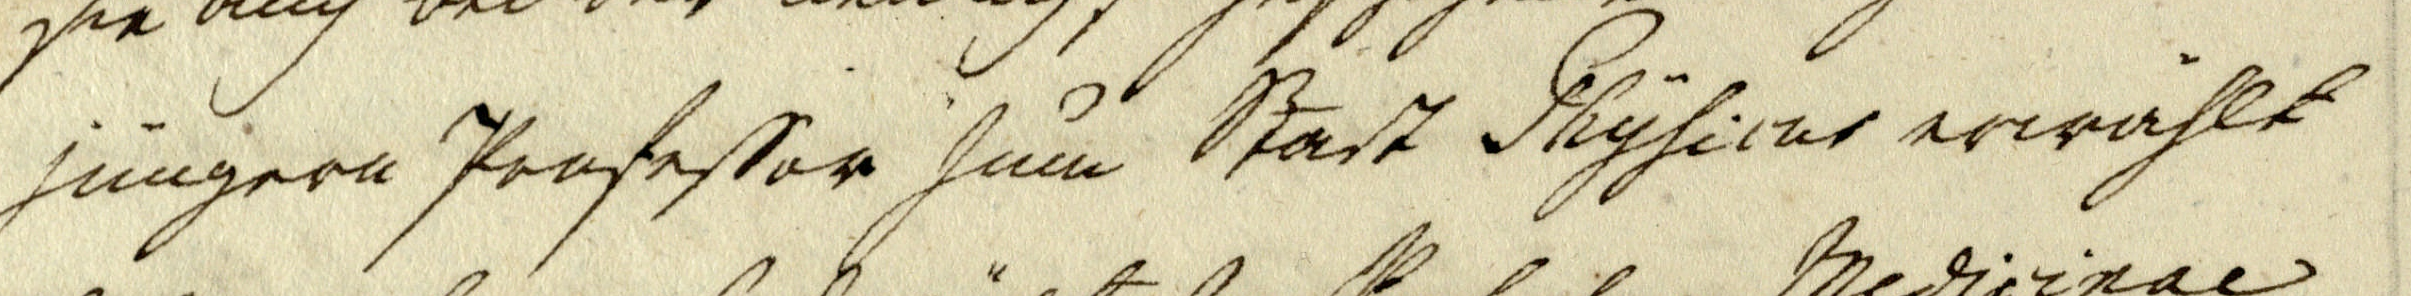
jüngern Professor zum Stadt Phÿsicus erwählt
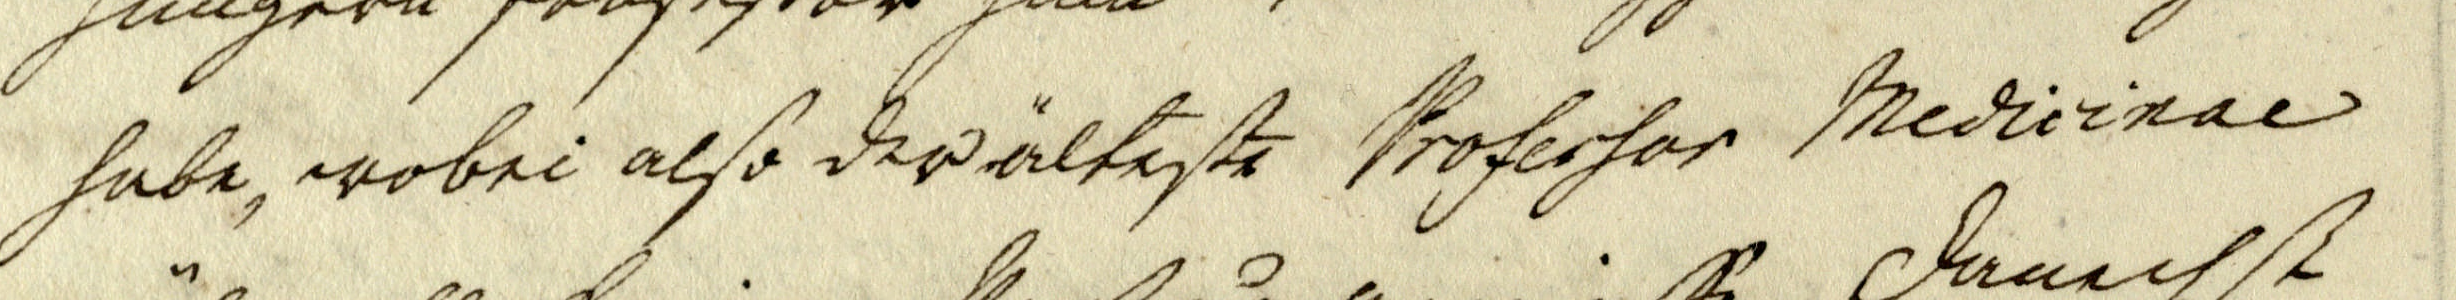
habe, wobei also der älteste Professor Medicinae
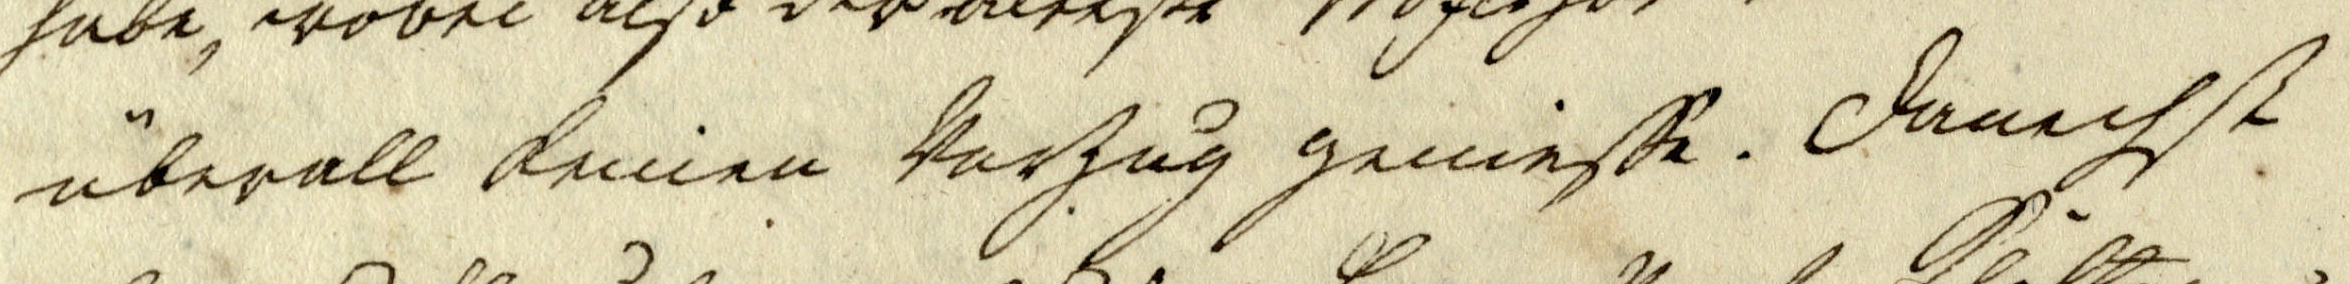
überall keinen Vorzug geniesse. Danechst
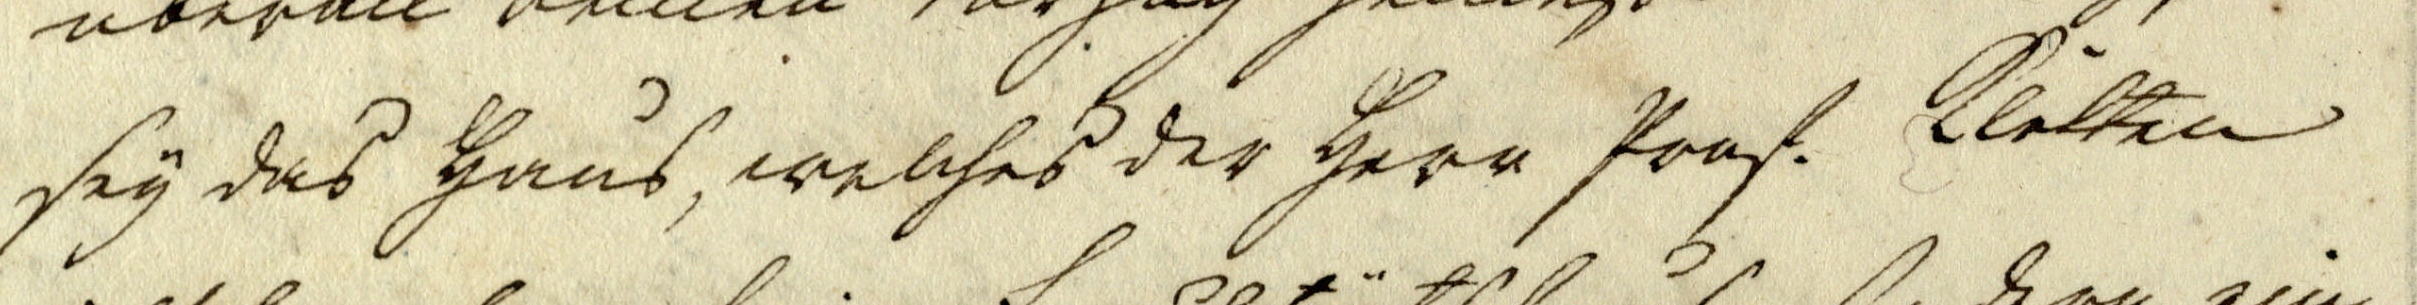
seÿ das Haus, welches der Herr Prof. Kletten
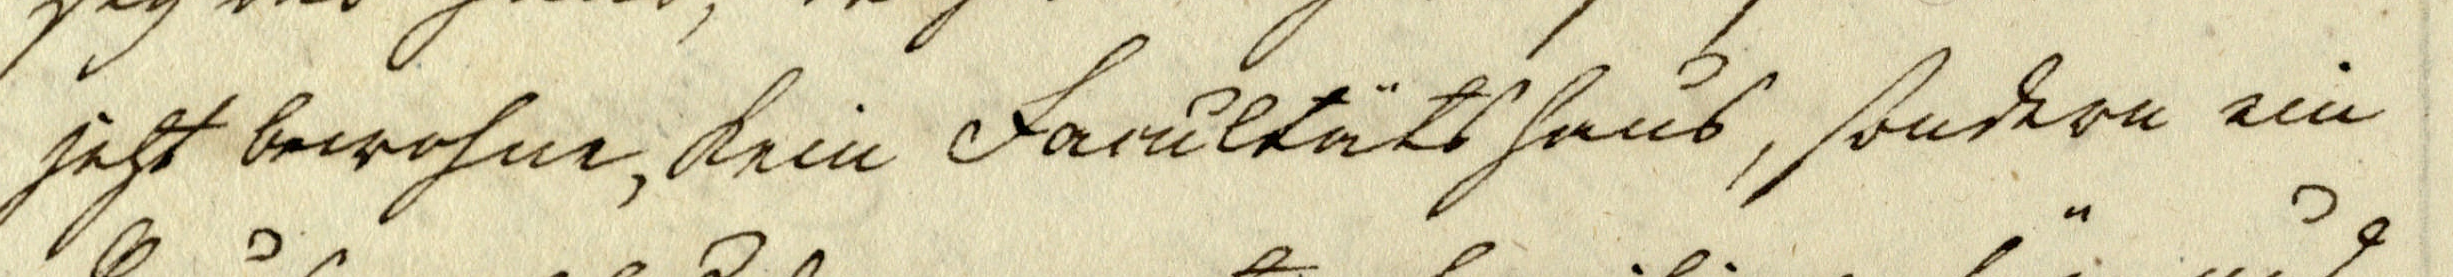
jetzt bewohne kein Facultätshaus, sondern ein
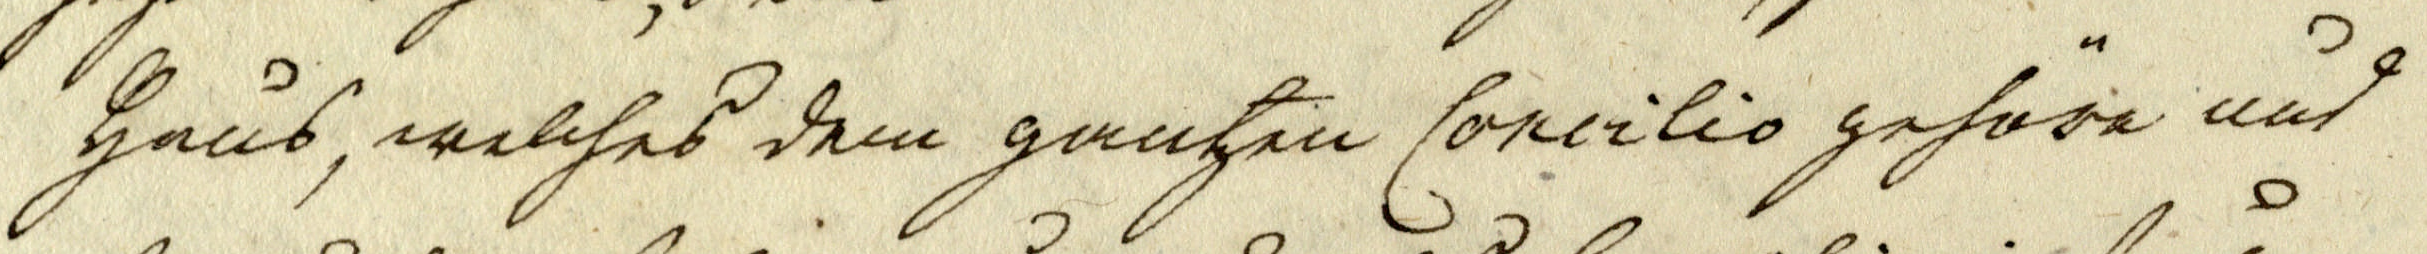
Haus, welches dem gantzen Concilio gehöre und
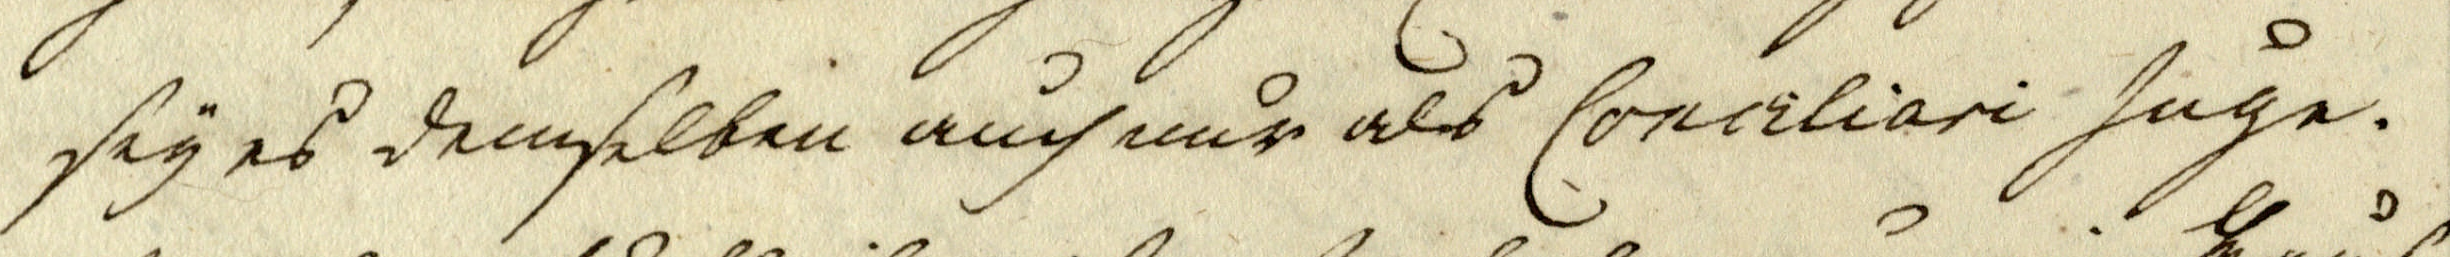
seÿ es demselben auch nur als Conciliari zuge¬
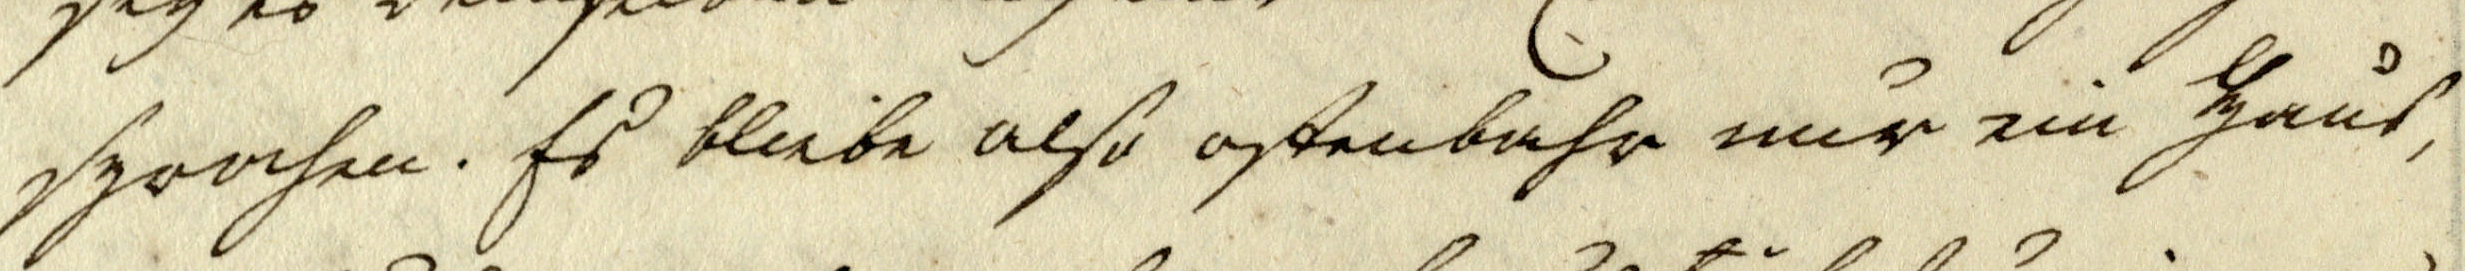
sprochen. Es bliebe also offenbahr nur ein Haus,
